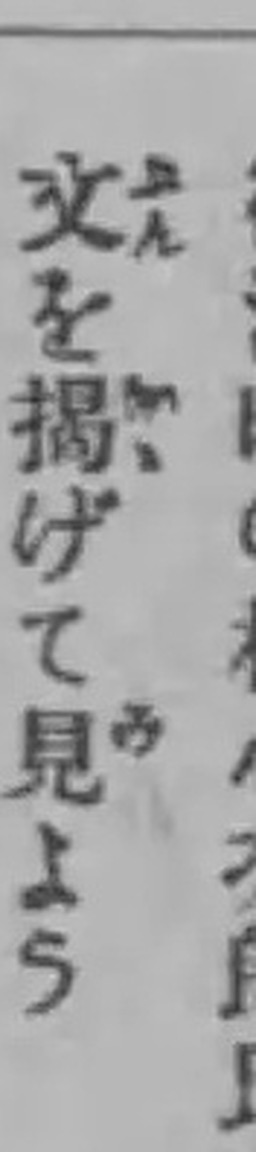文を掲げて見よう
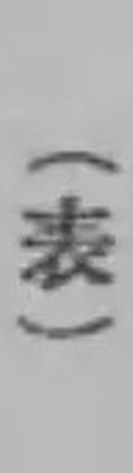(表)
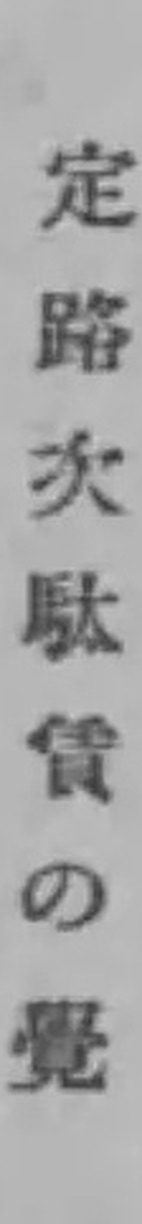定路次駄賃の覚
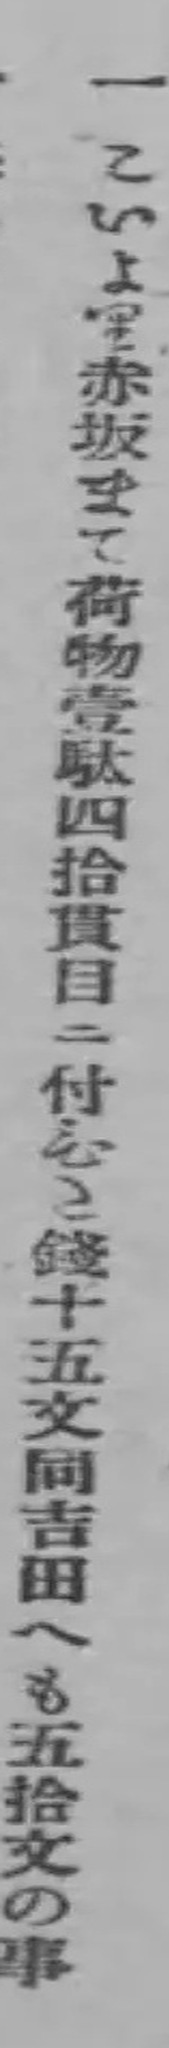一こいより赤坂まて荷物壱駄四拾貫目ニ付びた銭十五文同吉田へも五拾文の事
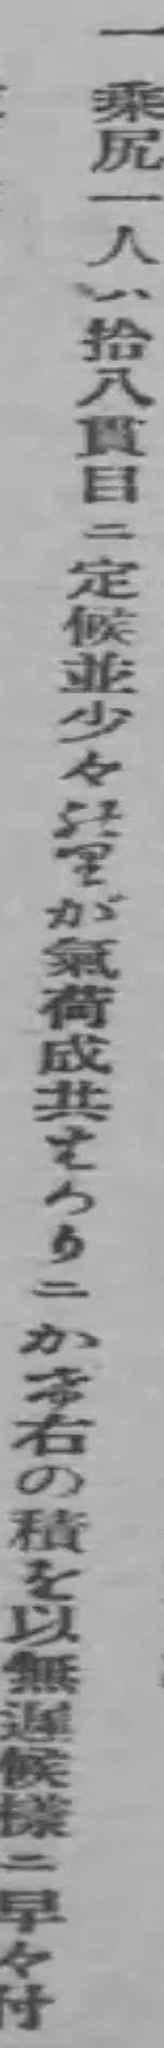一乗尻一人ハ拾八貫目ニ定候並少々のりが気荷成共はかりニかけ右の積を以無遅候様ニ早々付
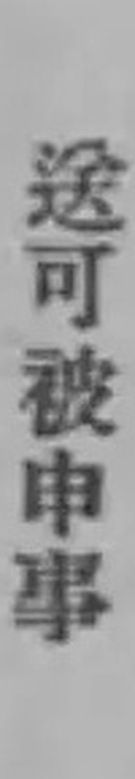送可被申事
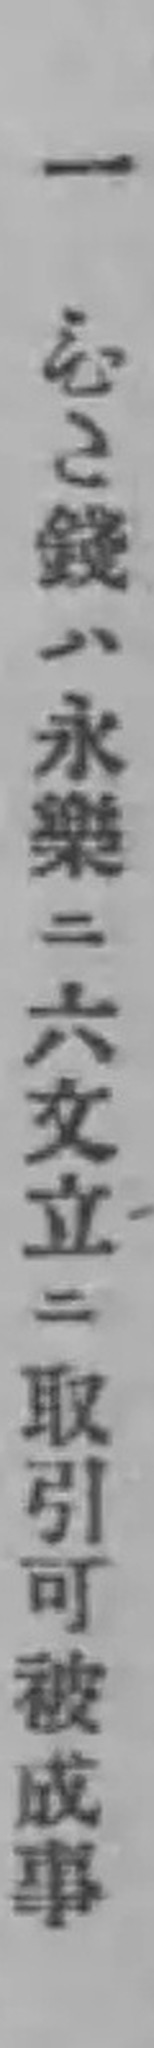一びた銭ハ永楽ニ六文立ニ取引可被成事
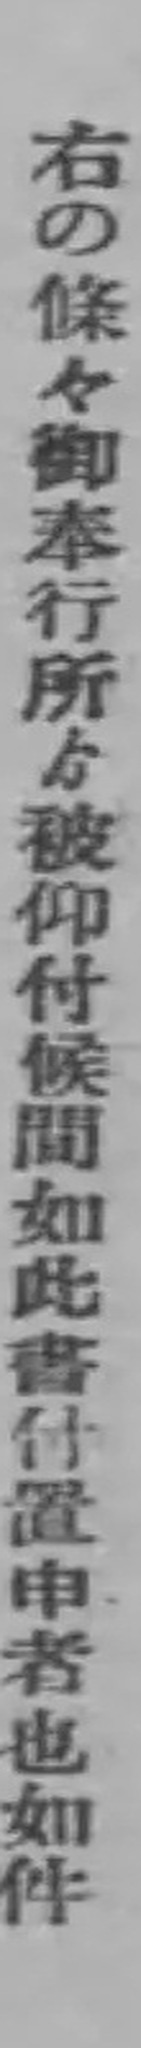右の条々御奉行所ゟ被仰付候間如此書付置申者也如件
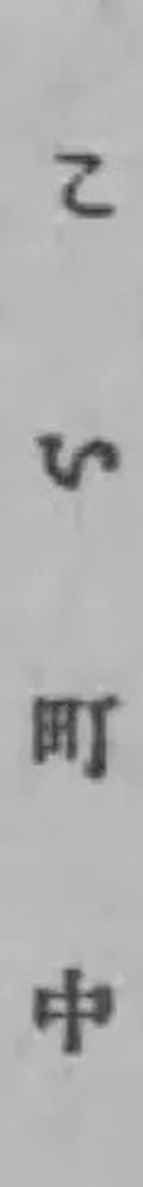こい町中
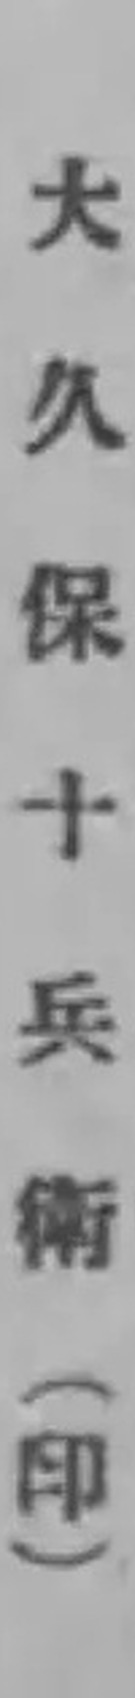大久保十兵衛(印)
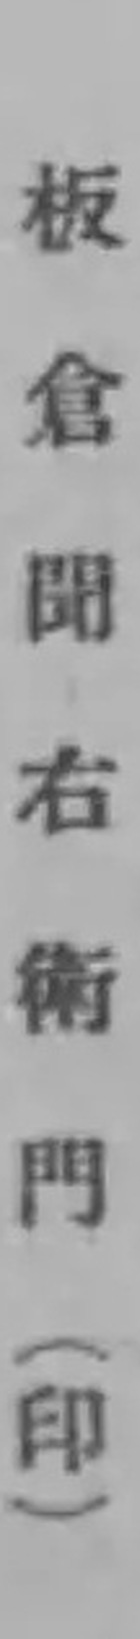板倉聞右衛門(印)
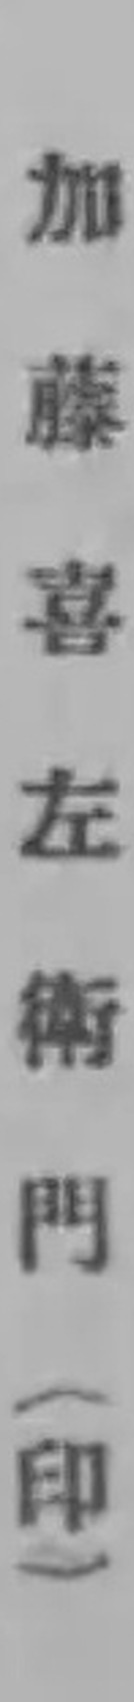加藤喜左衛門(印)
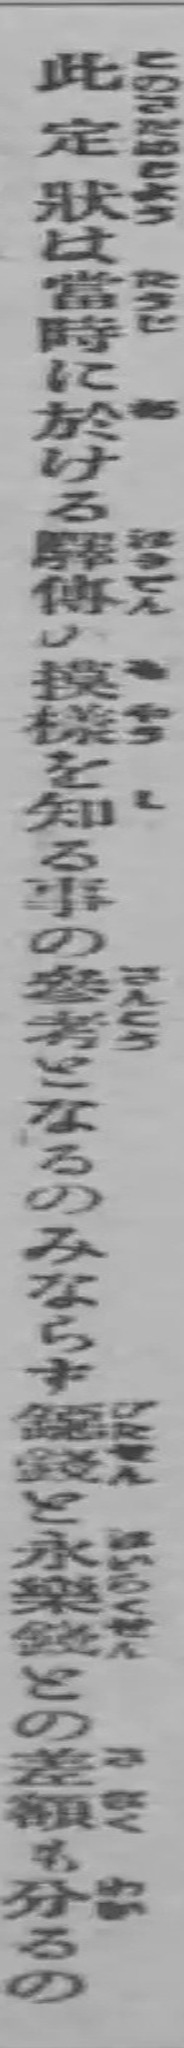此定状は当時に於ける駅伝の模様を知る事の参考となるのみならず鐚銭と永楽銭との差額も分るの
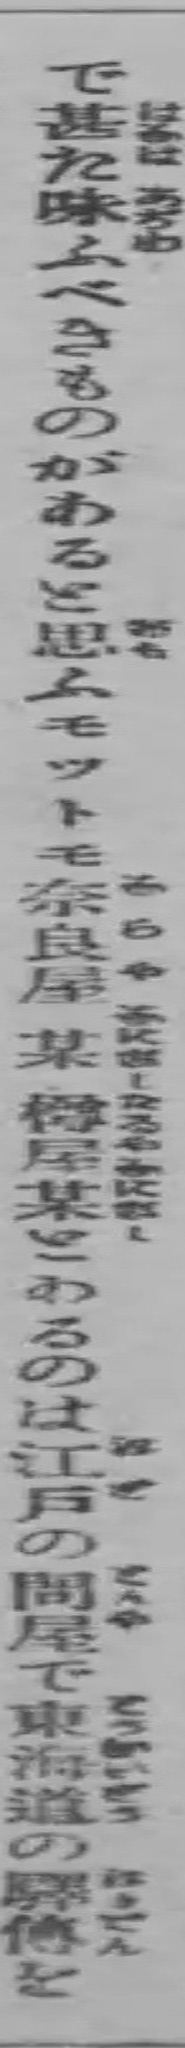で甚だ味ふべきものがあると思ふモツトモ奈良屋某樽屋某とあるのは江戸の問屋で東海道の駅伝を
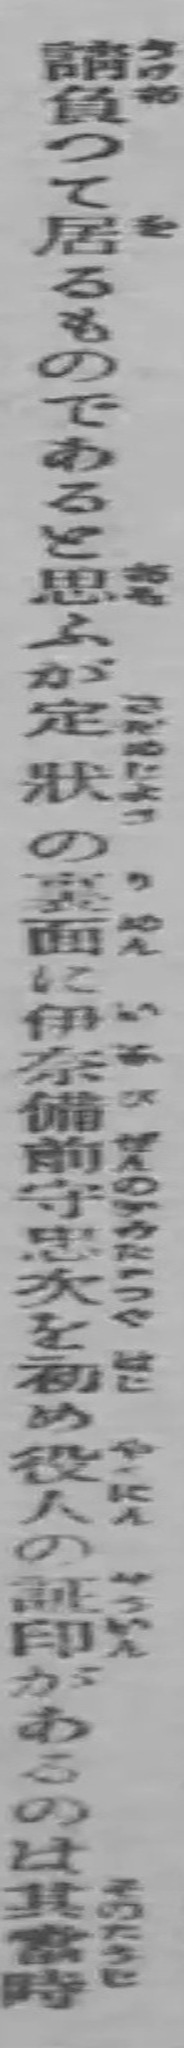請負つて居るものであると思ふが定状の裏面に伊奈備前守忠次を初め役人の証印があるのは其当時
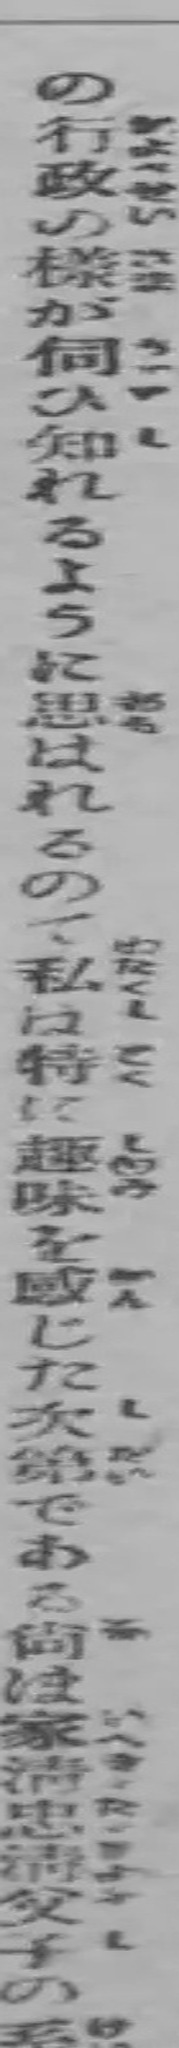の行政の様が伺ひ知れるように思はれるので私は特に趣味を感じた次第である尚ほ家清忠清父子の系
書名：豊橋市史談
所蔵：国立国会図書館 National Diet Library, JAPAN
